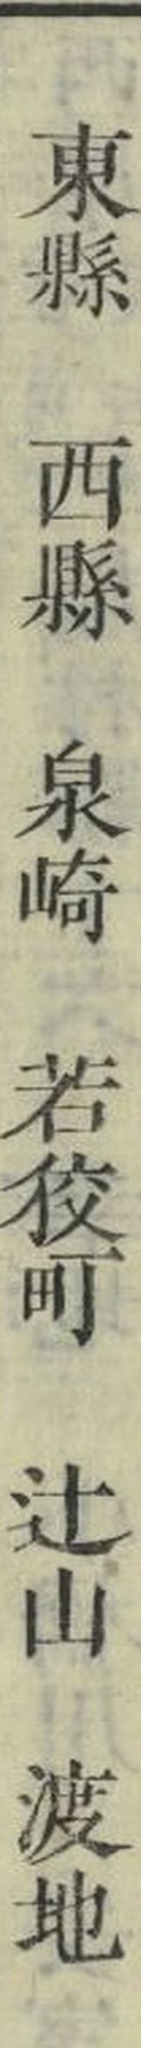東県西県泉崎若狡町辻山渡地

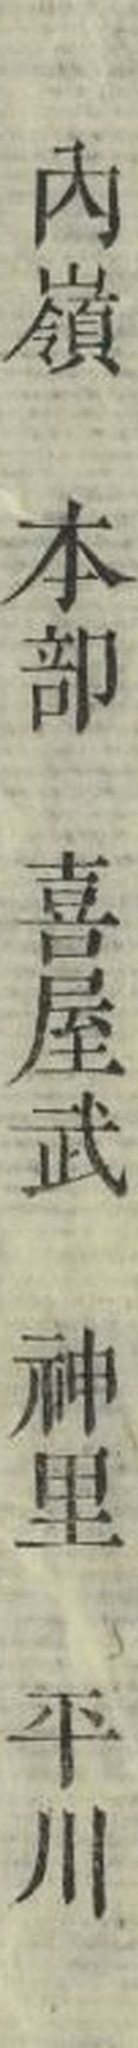内嶺本部喜屋武神里平川
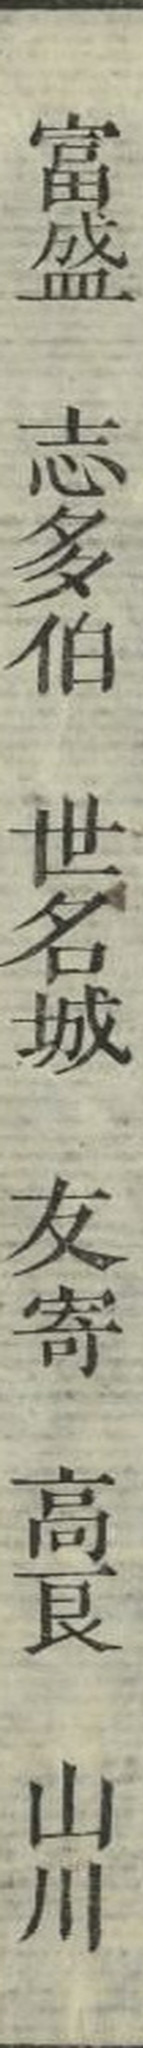富盛志多伯世名城友寄高良山川
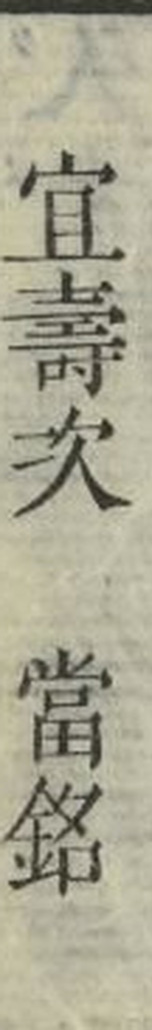宜寿次当銘
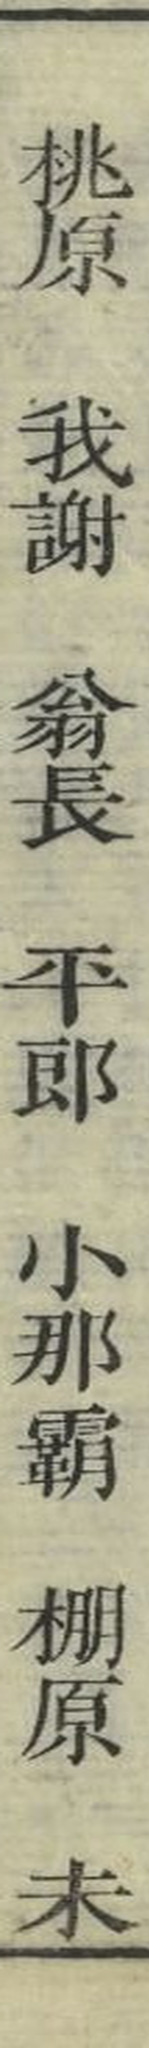桃原我謝翁長平郎小那覇棚原未
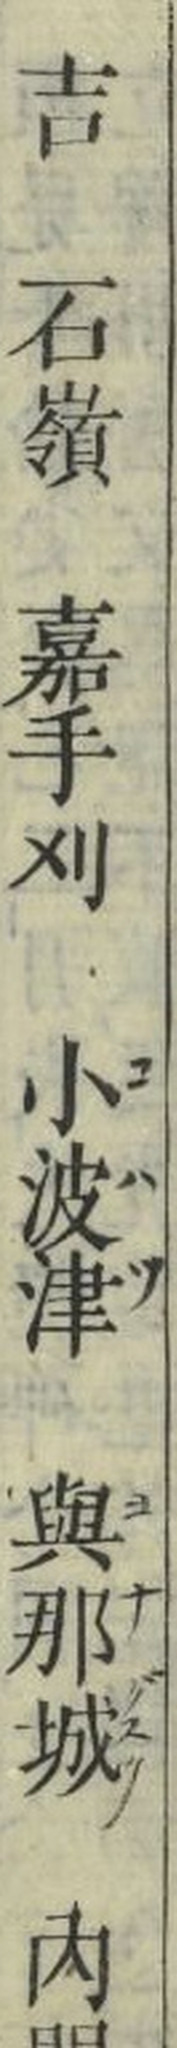吉石嶺嘉手刈小波津与那城内間
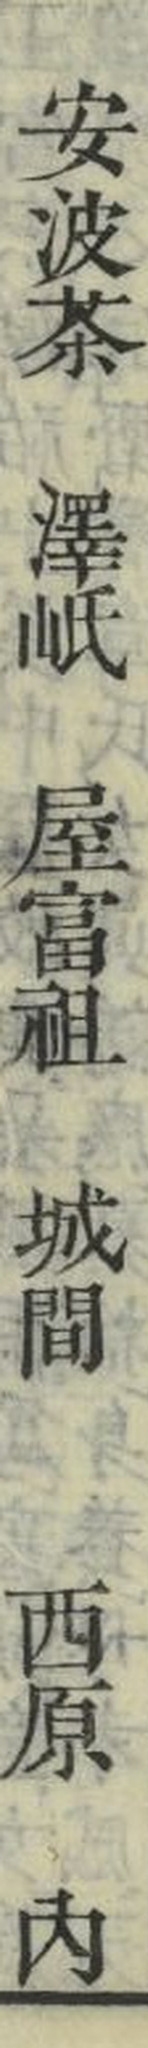安波茶沢㞴屋富祖城間西原内
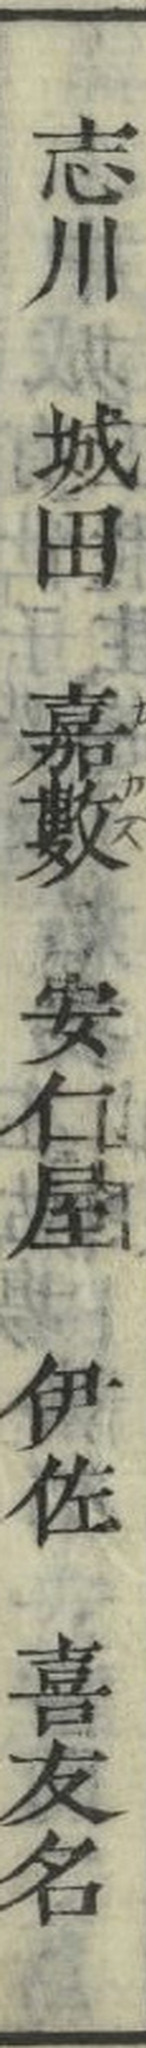志川城田嘉数安仁屋伊佐喜友名
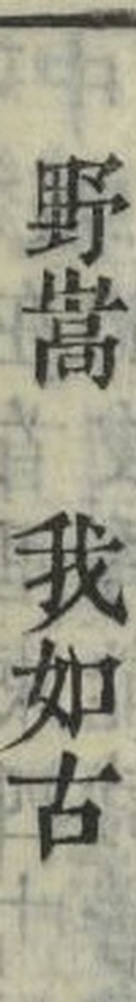野嵩我如古

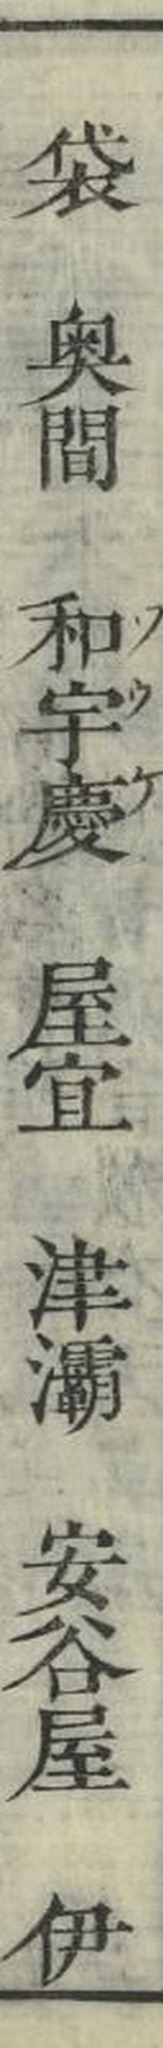袋奥間和宇慶屋宜津灞安谷屋伊
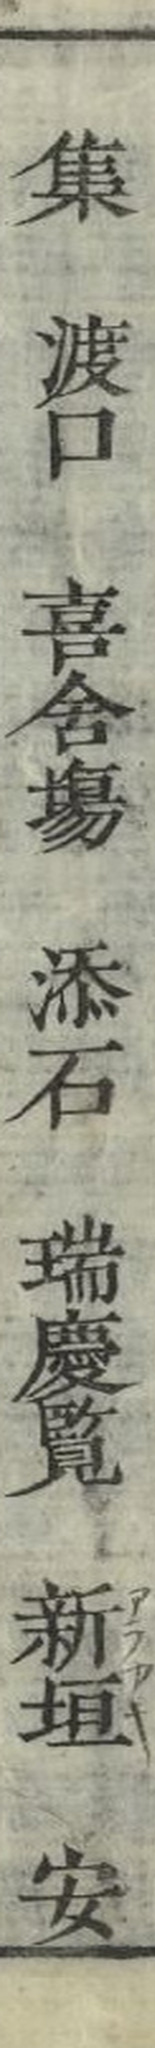集渡口喜舎場添石瑞慶覧新垣安
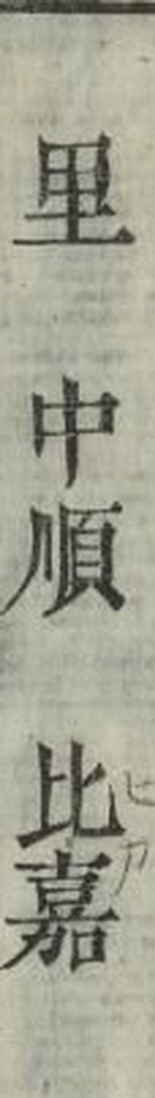里中順比嘉
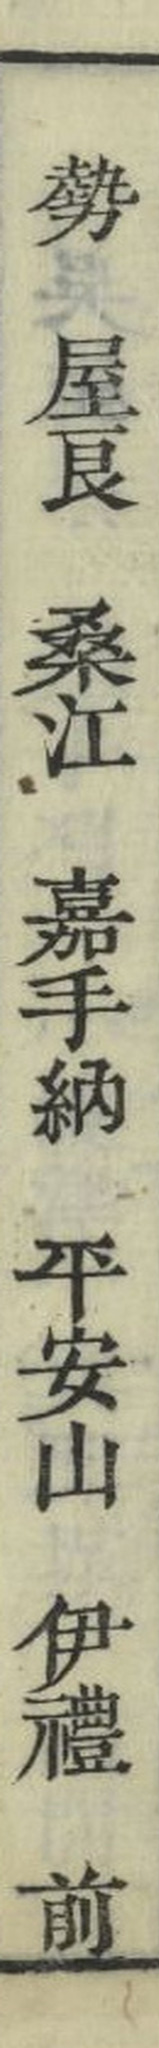勢屋良桑江嘉手納平安山伊礼前
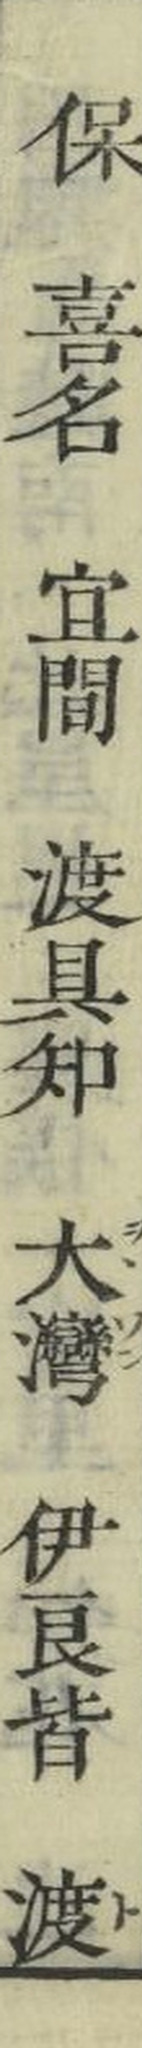保喜名宜間渡具知大湾伊良皆渡
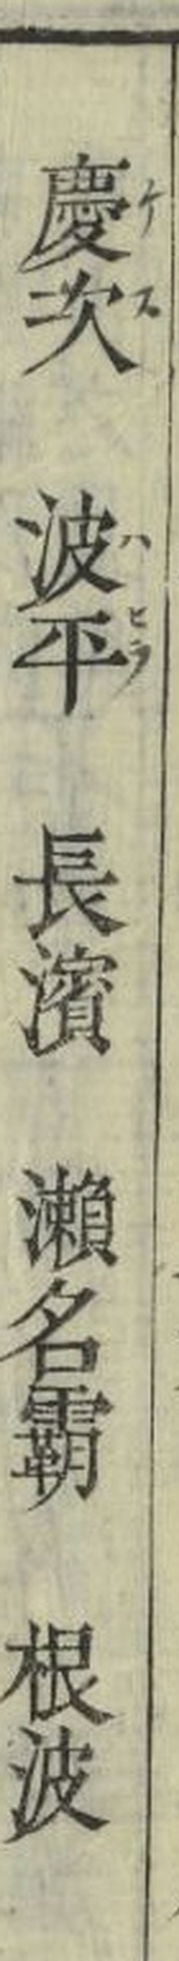慶次波平長浜瀬名覇根波
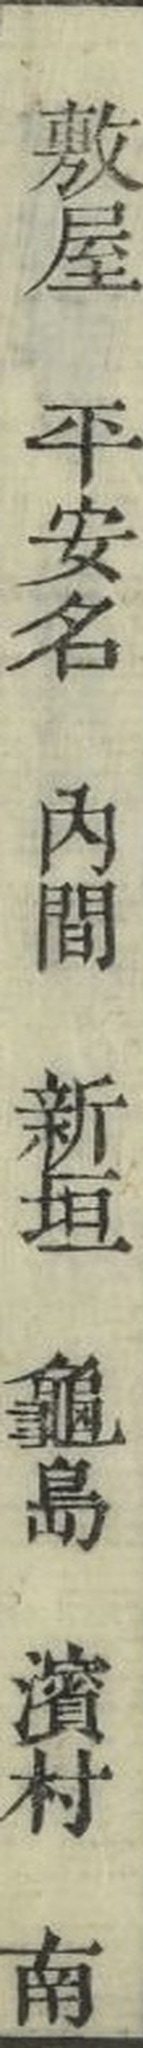敷屋平安名内間新垣亀島浜村南
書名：中山伝信録 巻四
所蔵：University of the Ryukyus Library
